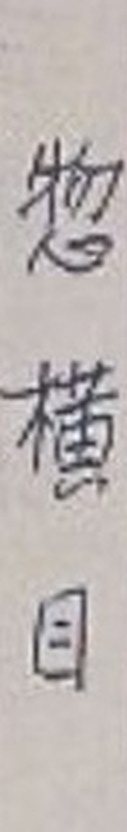惣横目
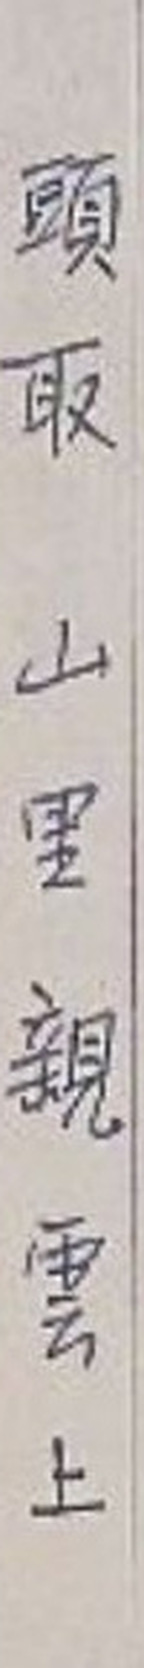頭取山里親雲上
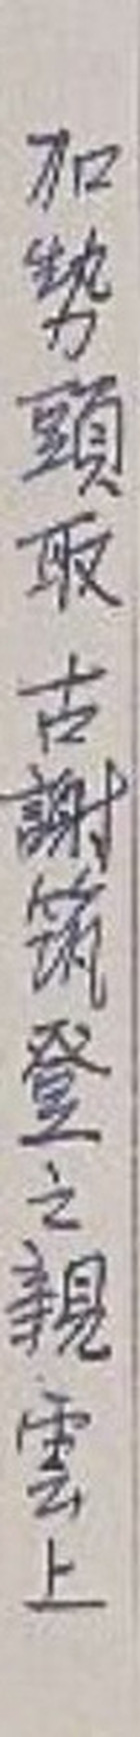加勢頭取古謝筑登之親雲上
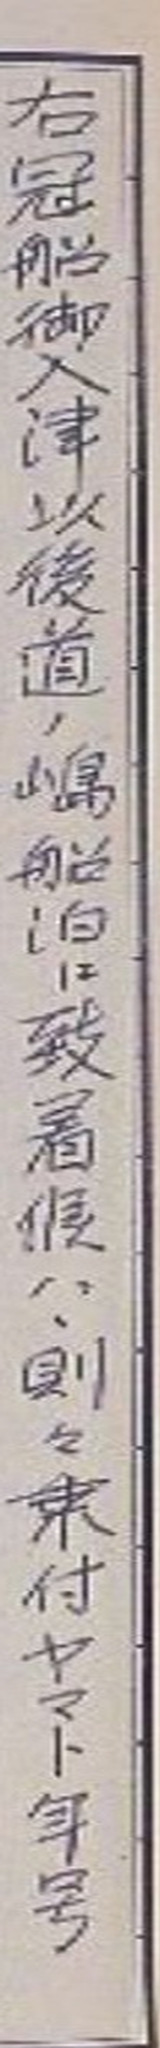右冠船御入津以後道の島船泊え致着候はゝ則々乗付やまと年号
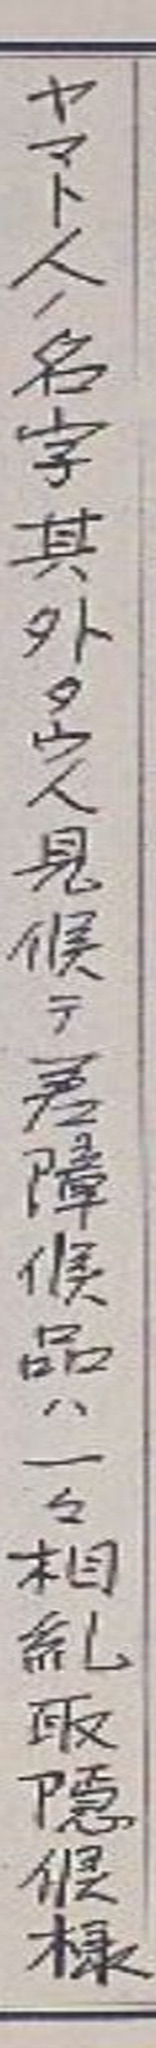やまと人の名字其外たう人見候て差障候品は一々相糺取隠候様
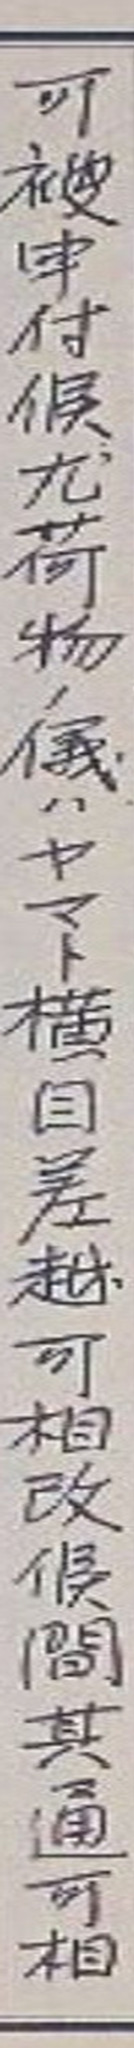可被申付候尤荷物の儀はやまと横目差越可相改候間其通可相
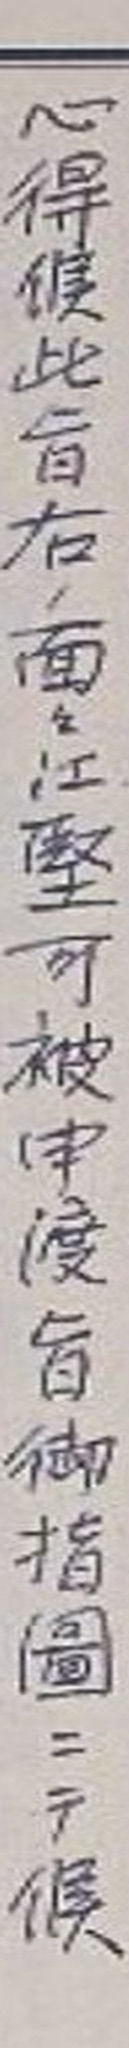心得候此旨右の面々え堅可被申渡旨御指図にて候
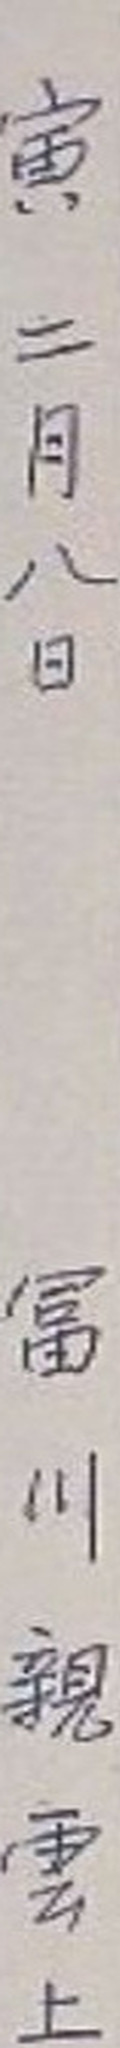寅二月八日冨川親雲上
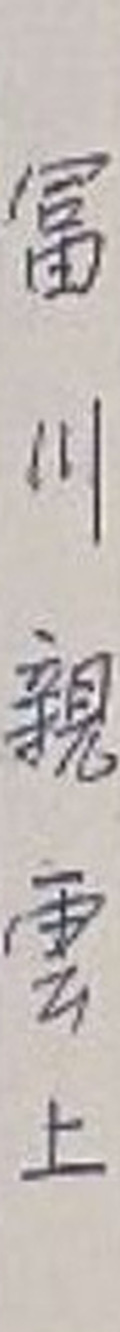冨島親雲上
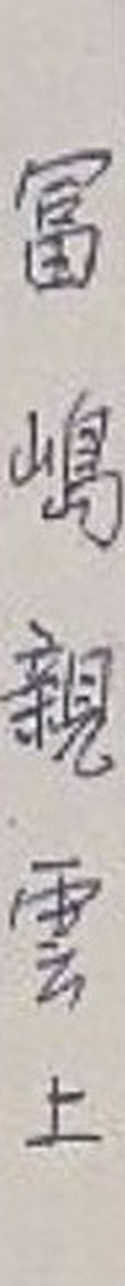冨島親雲上
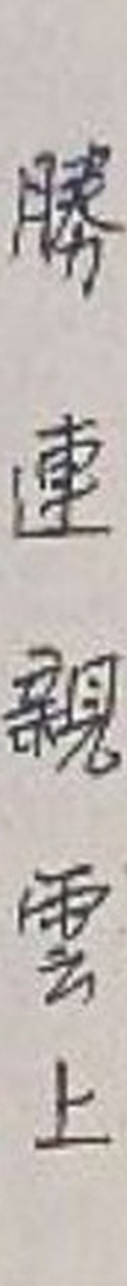勝連親雲上
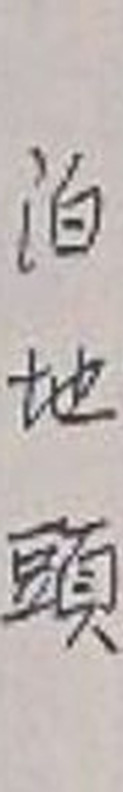泊地頭
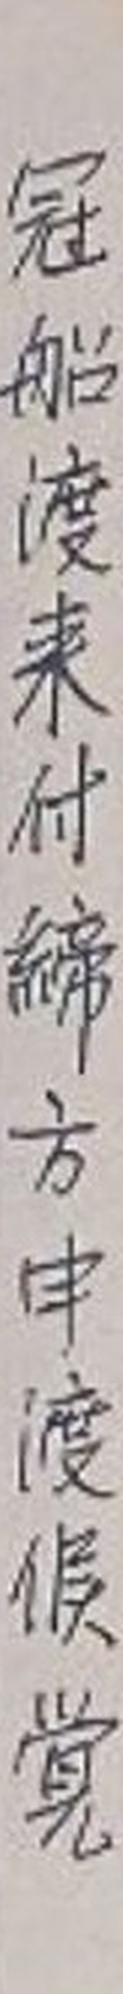冠船渡来付締方申渡候覚
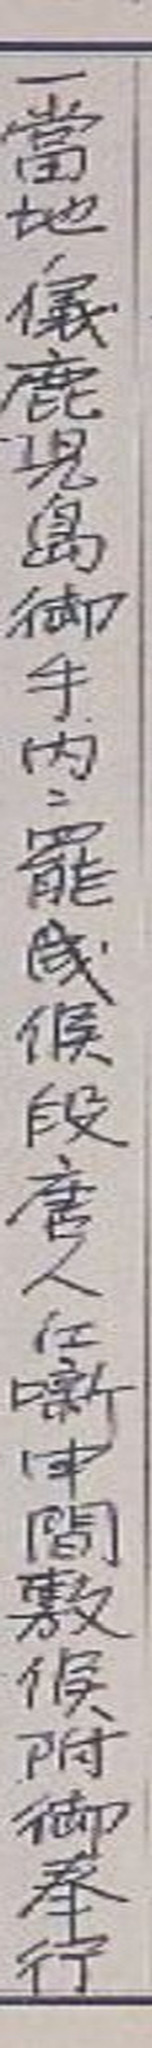一当地の儀鹿児島御手内に罷成候段唐人え噺申間敷候附御奉行
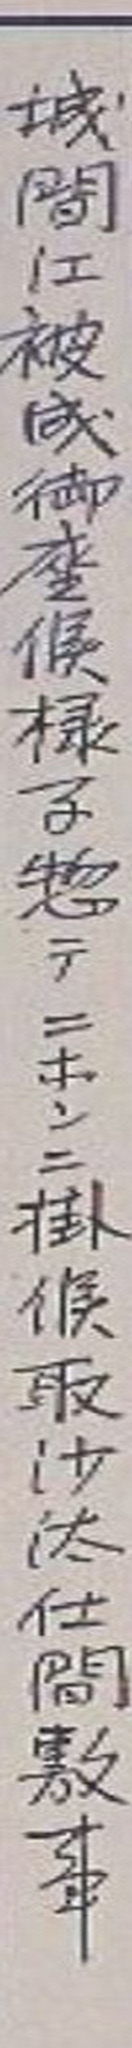城間え被成御座候様子惣てにほんに掛候取沙汰仕間敷事
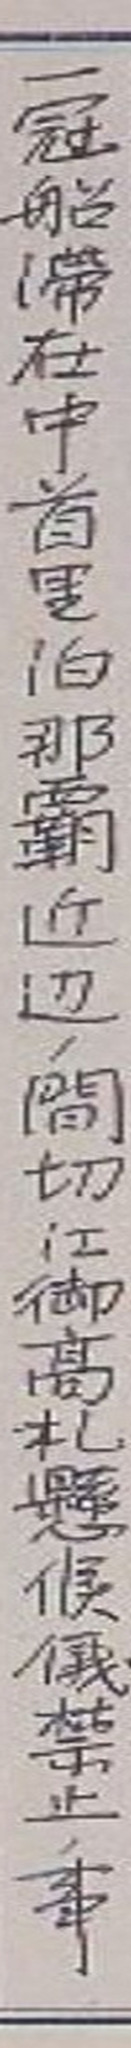一冠船滞在中首里泊那覇近辺の間切え御高札懸候儀禁止の事
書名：支那冊封使来琉諸記 下巻
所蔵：University of the Ryukyus Library
